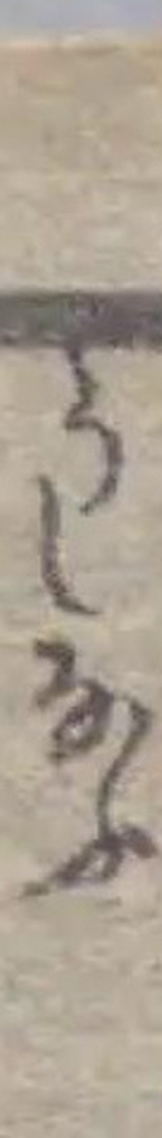うしなふ
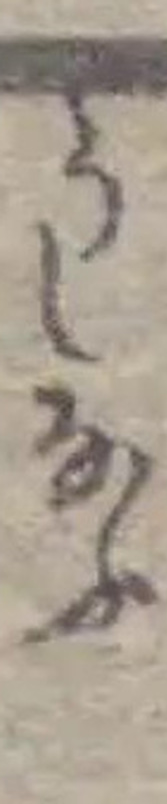うしなふ
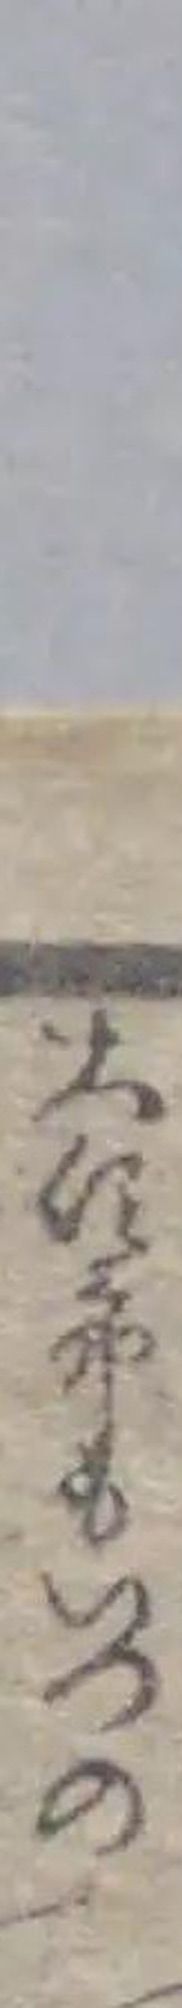大次郎もいつの
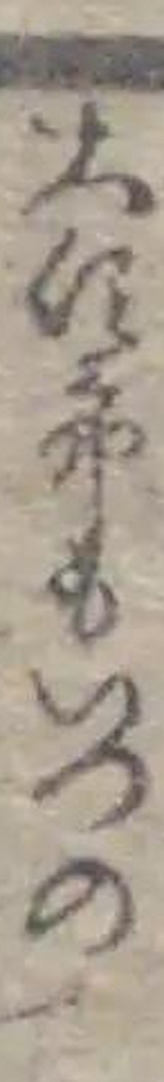大次郎もいつの
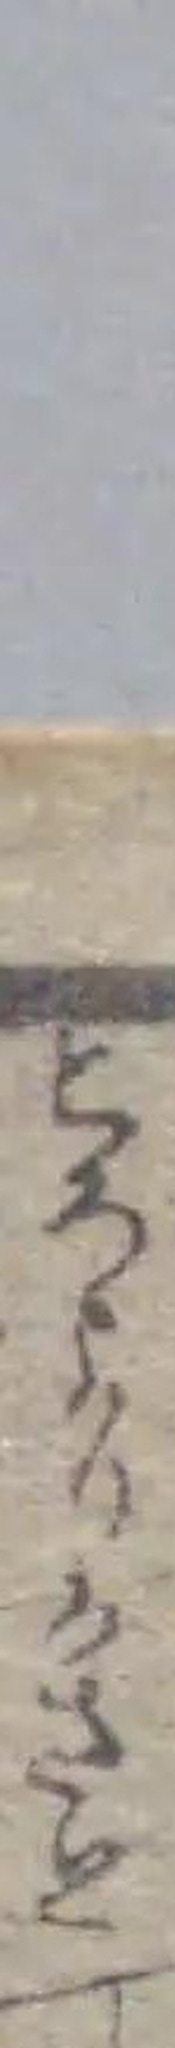ころよりかさと
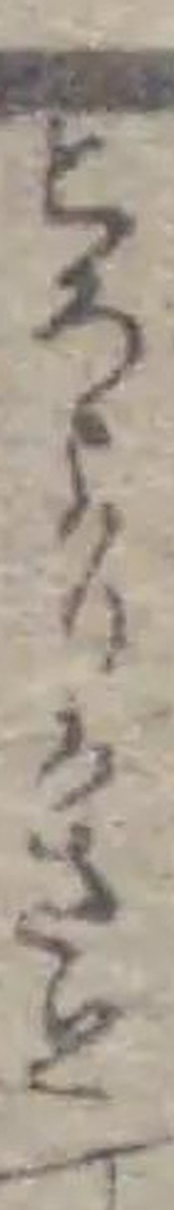ころよりかさと
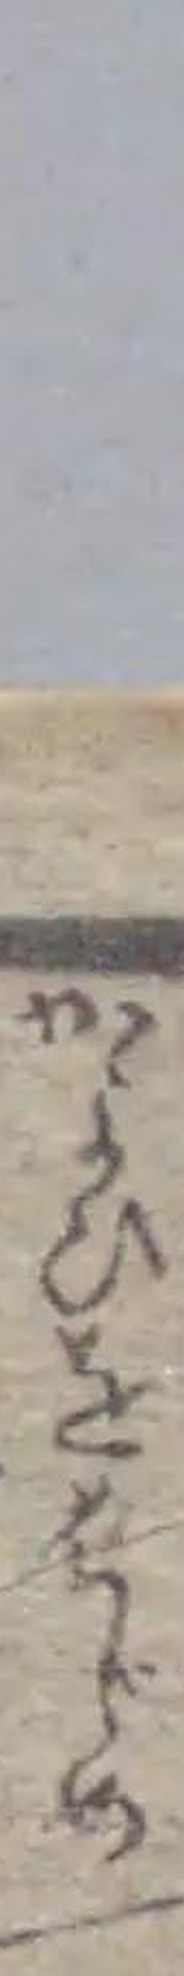かよひをはじめ
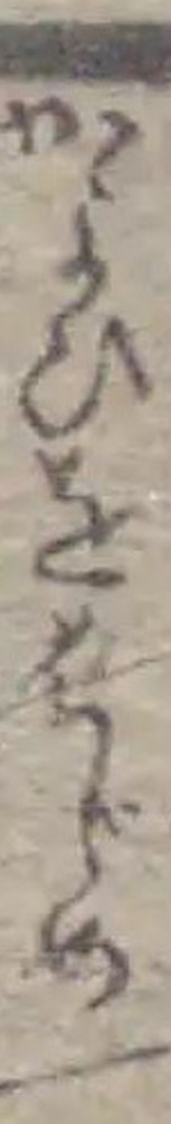かよひをはじめ
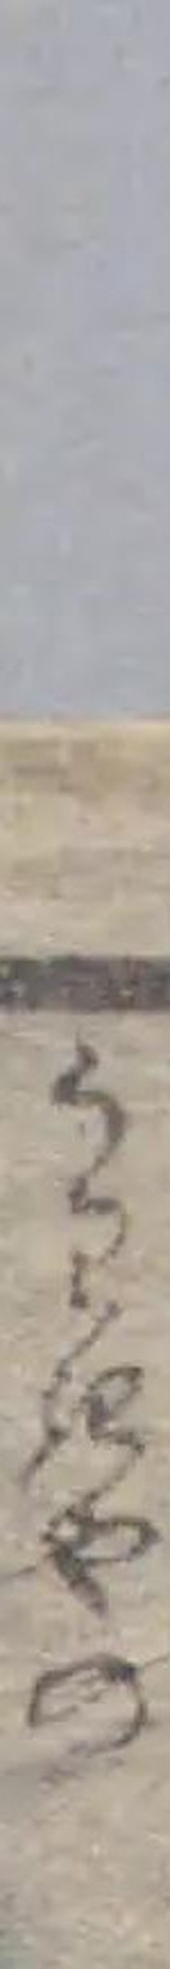うわきやの
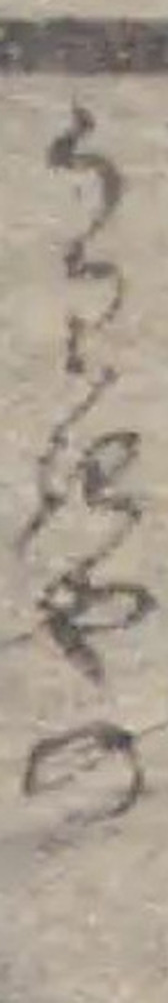うわきやの
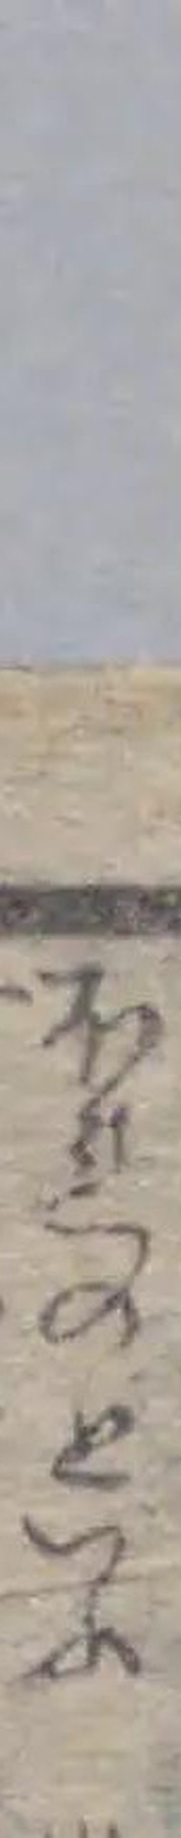ほれのといふ
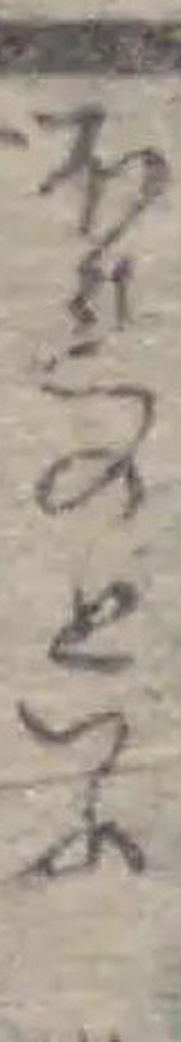ほれのといふ
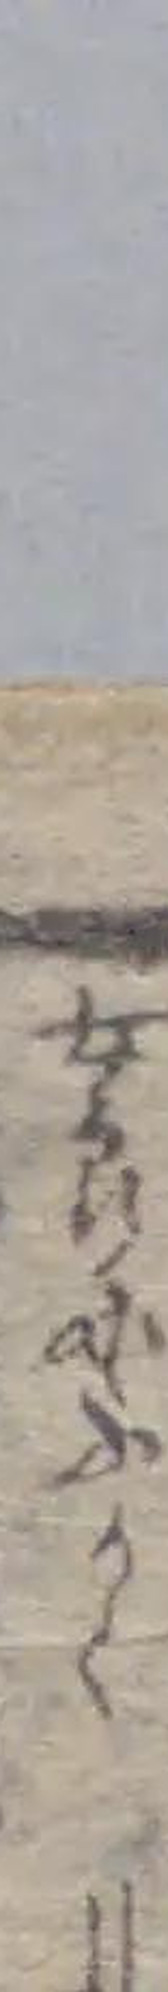女郎にふかく
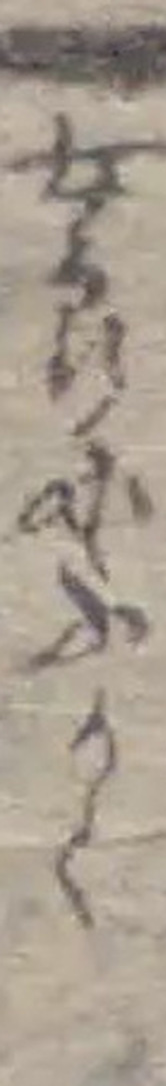女郎にふかく
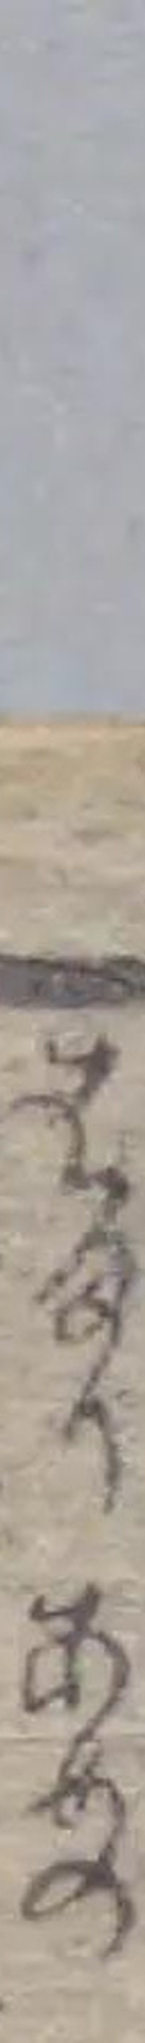はまりあめの
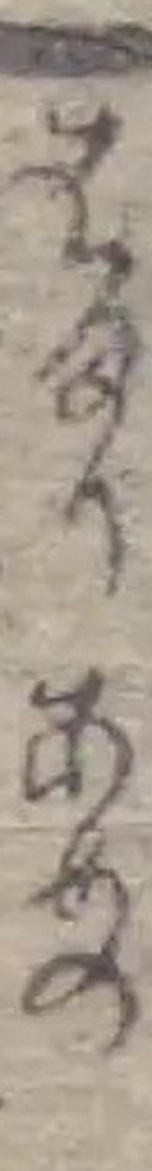はまりあめの
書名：福壽海旡量品玉 3巻
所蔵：国立国会図書館 National Diet Library, JAPAN
